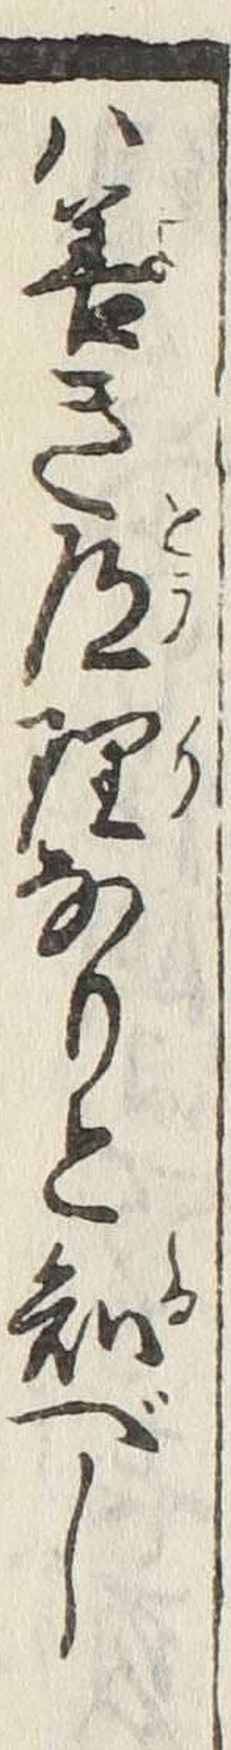は善き道理なりと知べし
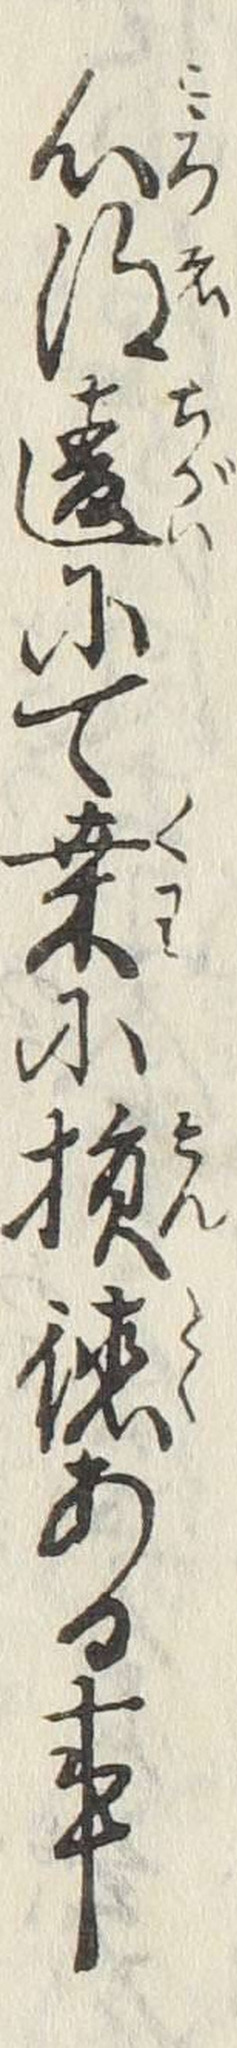心得違にて桑に損徳ある事
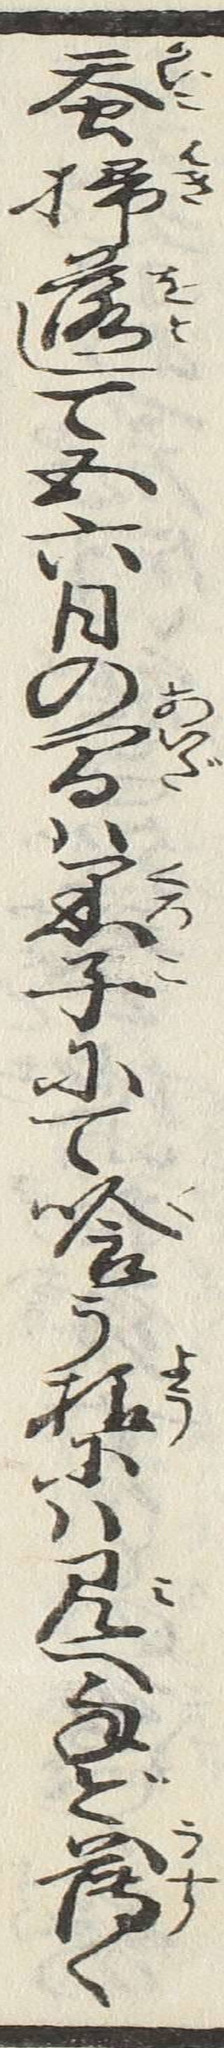蚕掃落して五六日の間は黒子にて喰う様には見へねど薄く
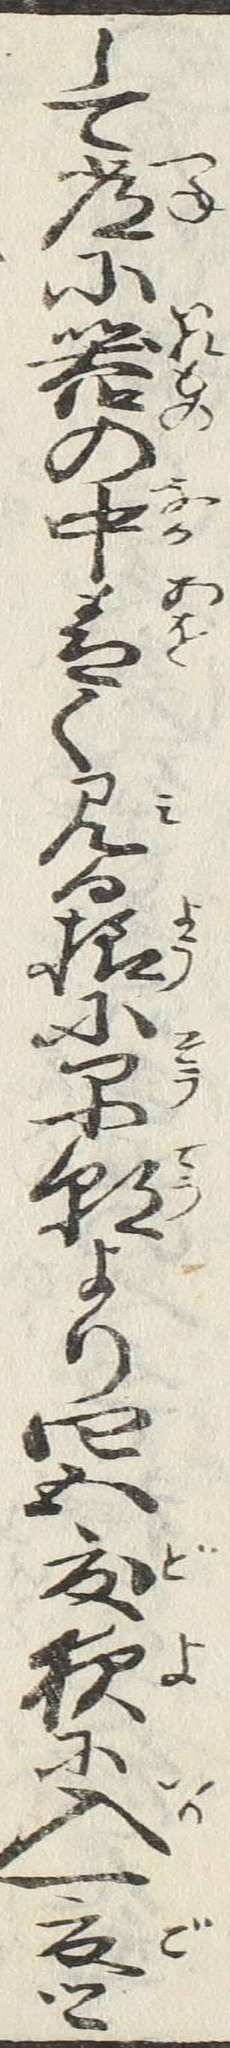して常に器の中青く見る様に早朝より四五度夜に入一度ツゝ
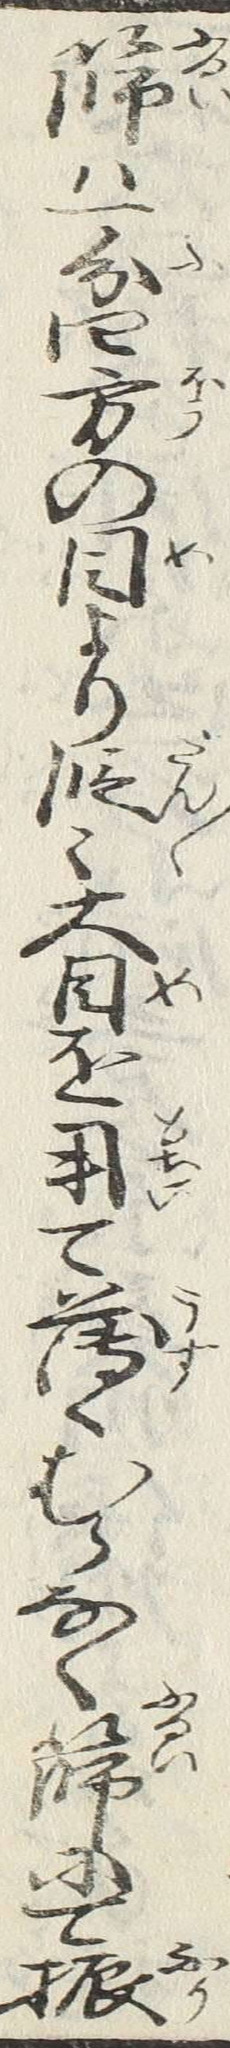篩は一分四方の目より段々大目を用て薄くむらなく篩にて振
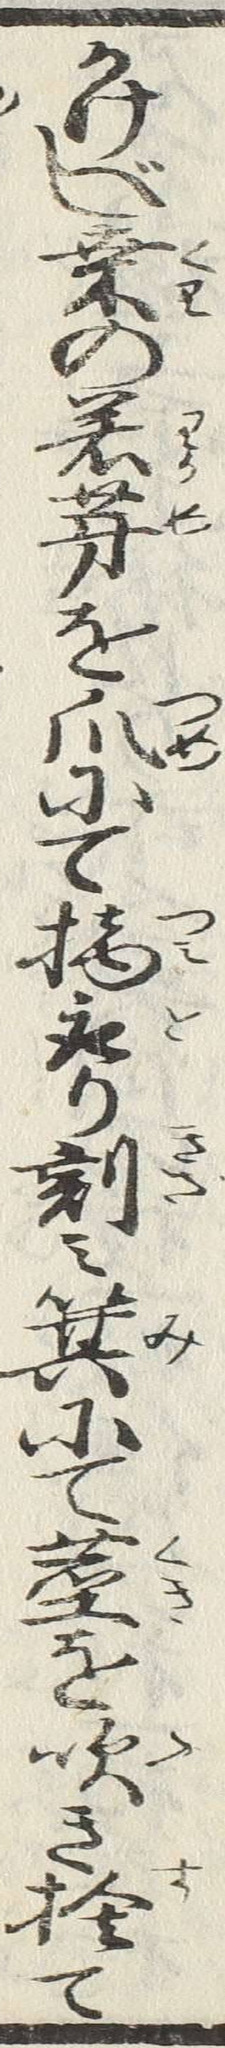かけべし桑の若芽を爪にて摘取り刻み箕にて茎を吹き捨て
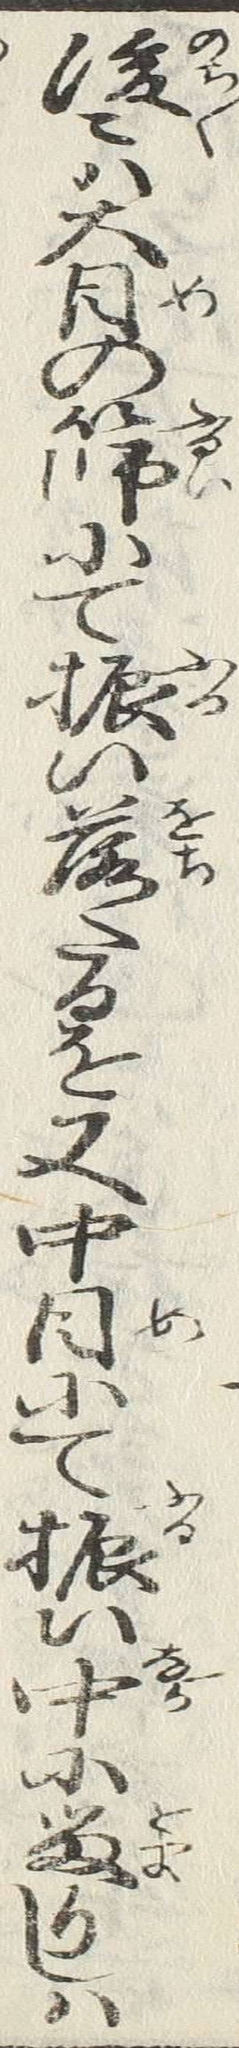後々は大目の篩にて振い落たるを又中目にて振い中に留りしは
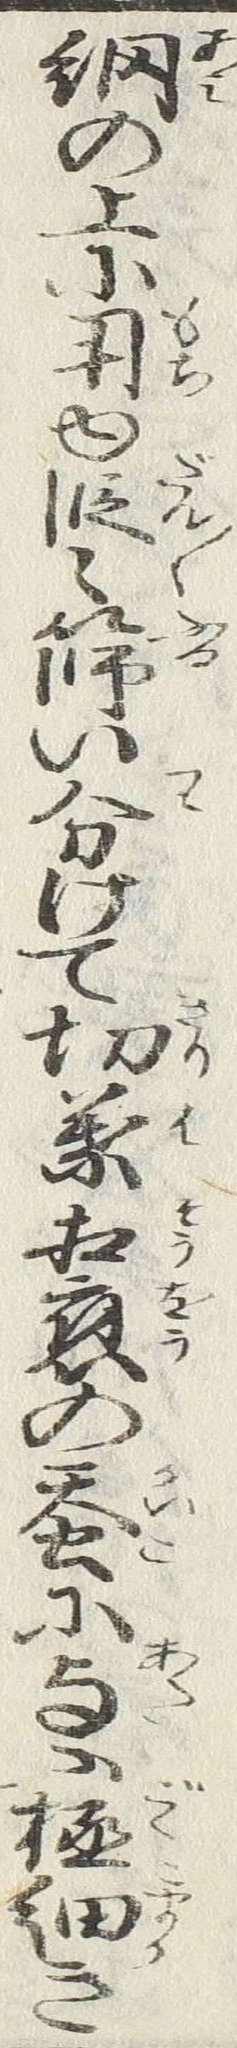網の上に用ゆ段々篩い分けて切葉相應の蚕に与ふ極細き
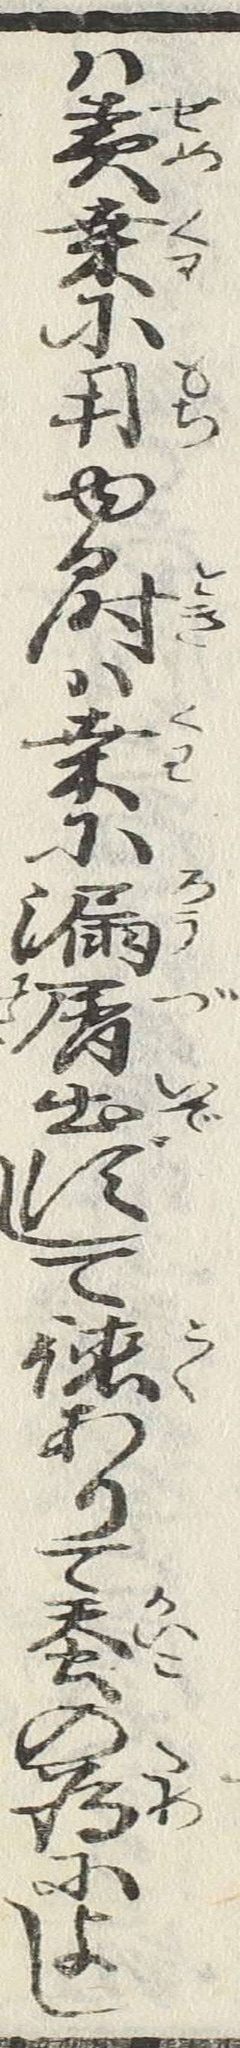は責桑に用ゆる時は桑に漏屑出ずして徳ありて蚕の為によし
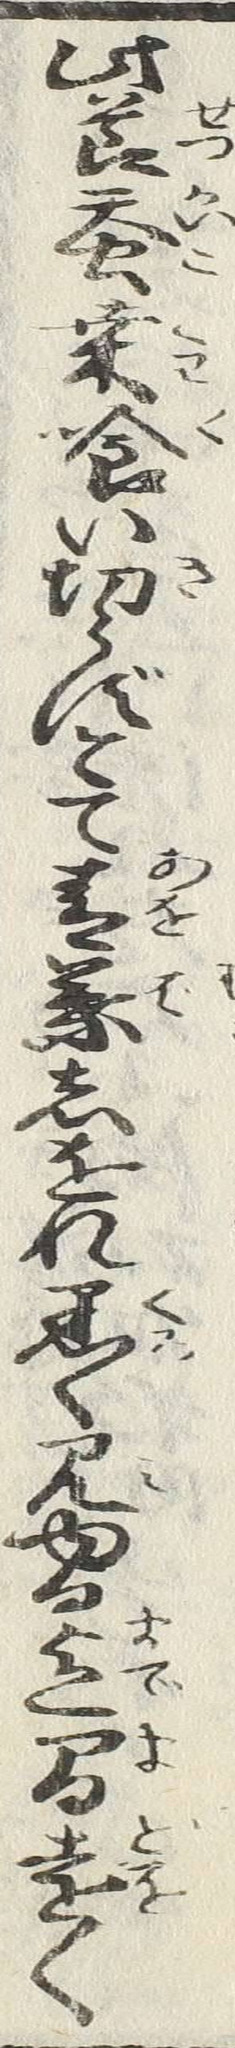此節蚕桑喰い切らずとて青葉しをれ黒く見ゆる迄間遠く
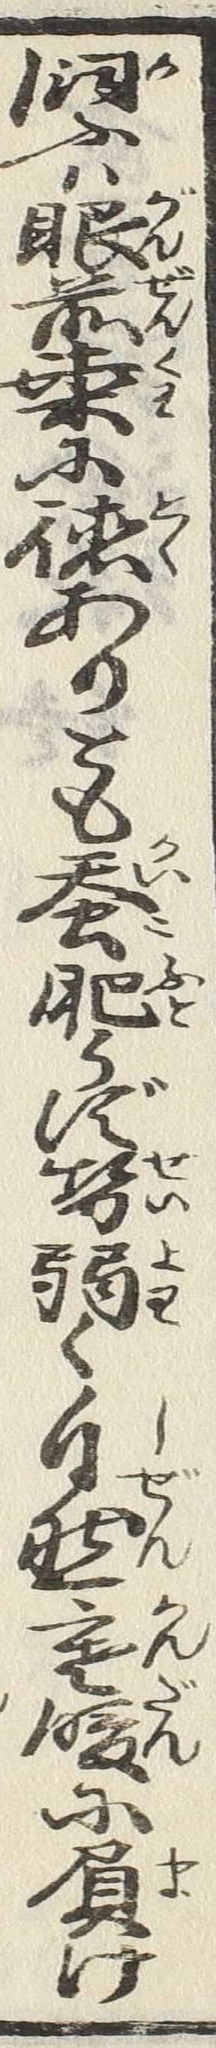飼ふは眼前桑に徳ありとも蚕肥らず勢弱く自然寒暖に負け
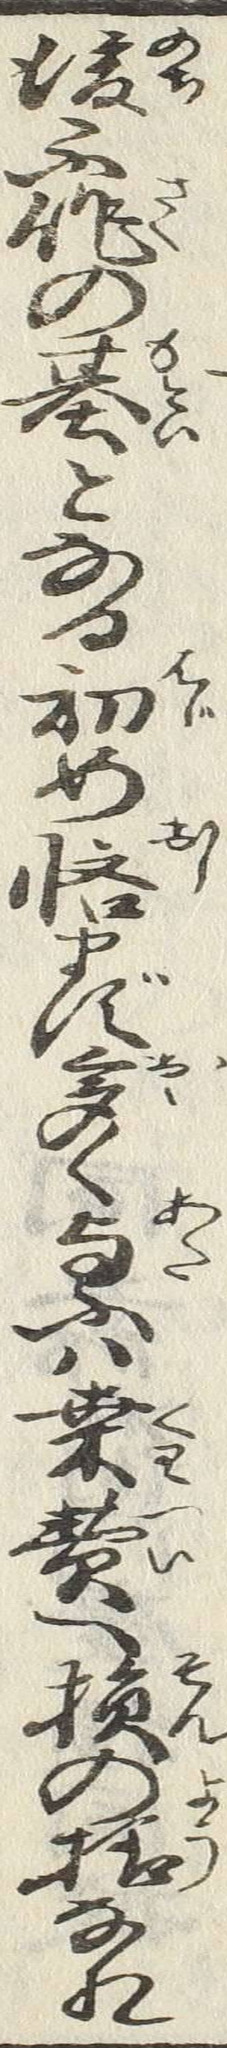後ふ作の基となる初め悋まず多く与ふは桑費へ損の様なれ
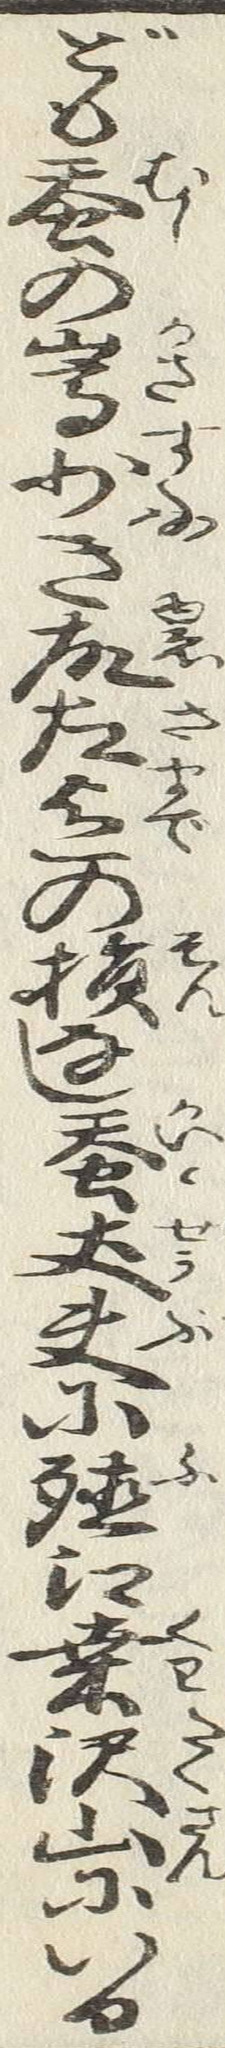ども蚕の嵩少き故左迄の損なし蚕丈夫に殖え桑沢山にいる
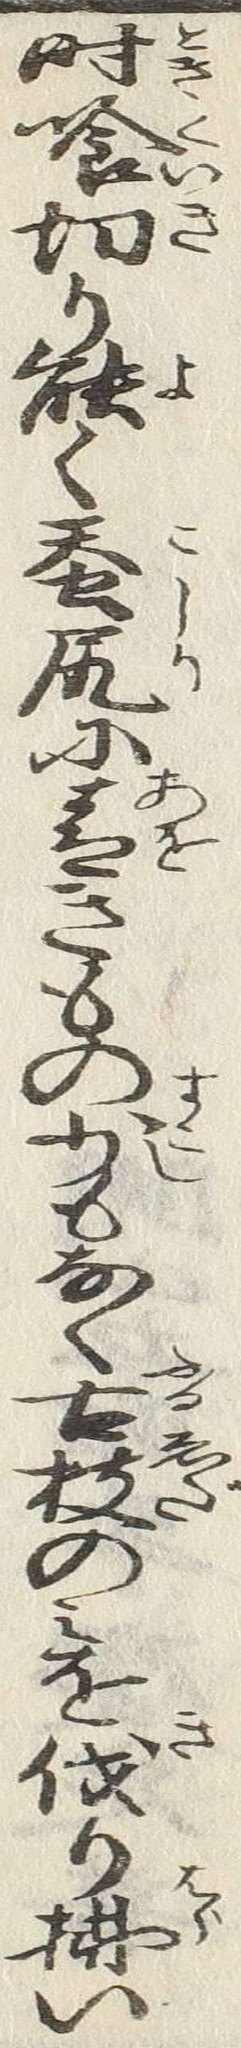時喰切り能く蚕尻に青きもの少もなく古枝のみを伐り拂い
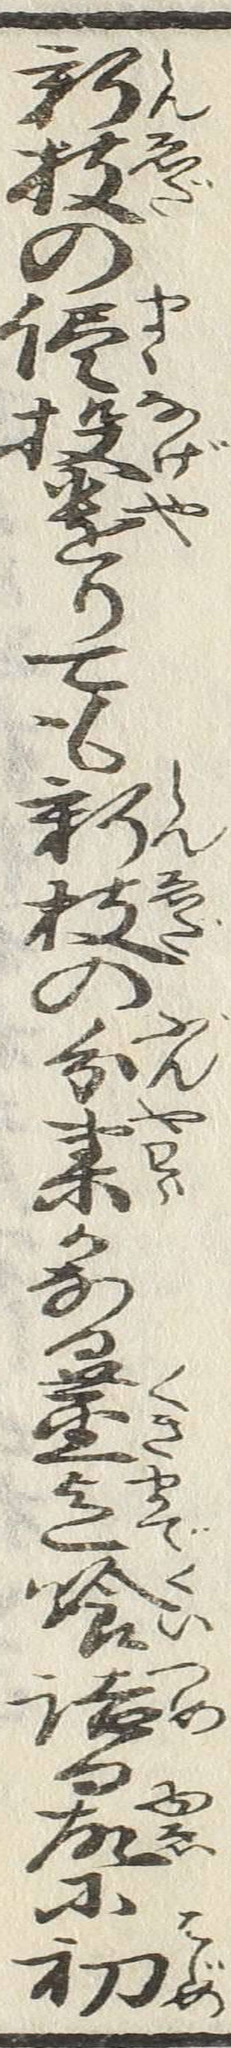新枝の侭投遣りても新枝の分柔かなる茎迄喰詰る故に初
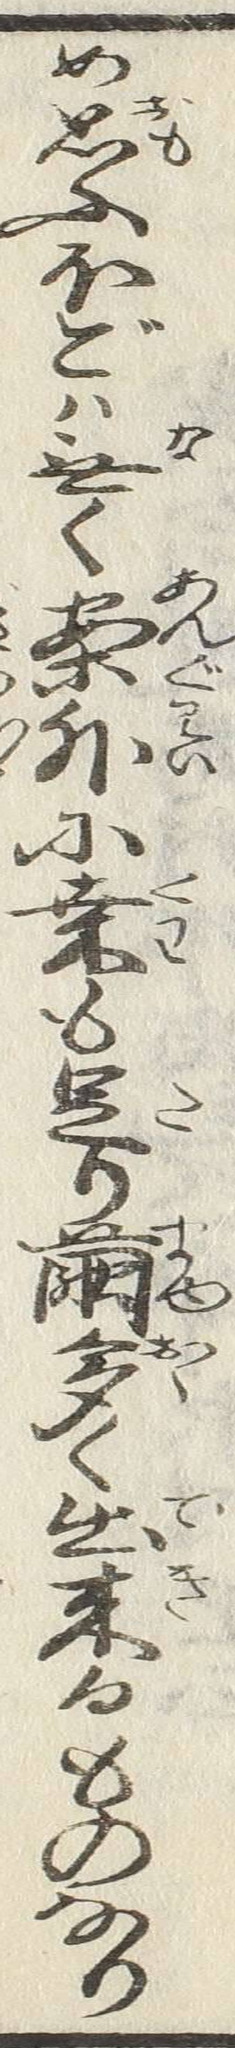め思ふほどは無く案外に桑も足り繭多く出来るものなり
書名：養蠶實驗録
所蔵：東京大学農学生命科学図書館 国文学研究資料館
